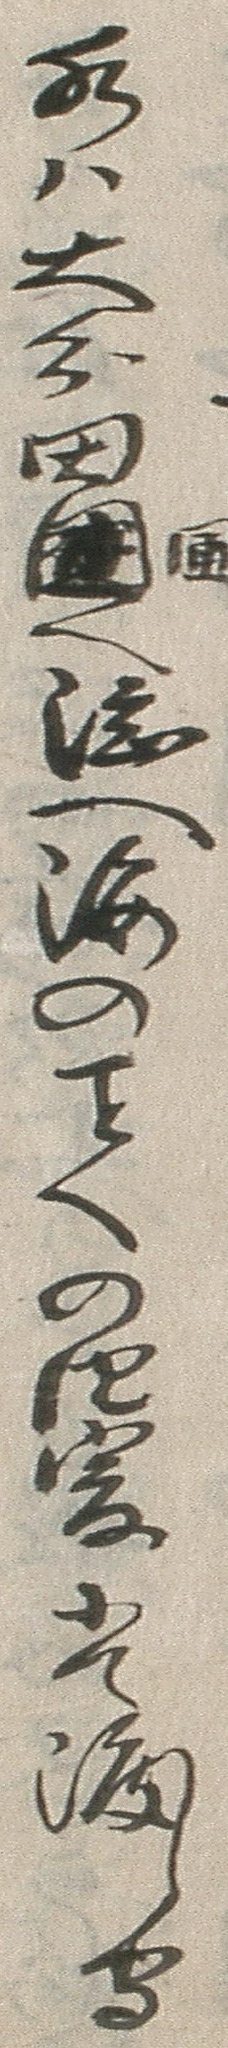水は大分田圃へ湛へ海のことくの由爰にて渡し守
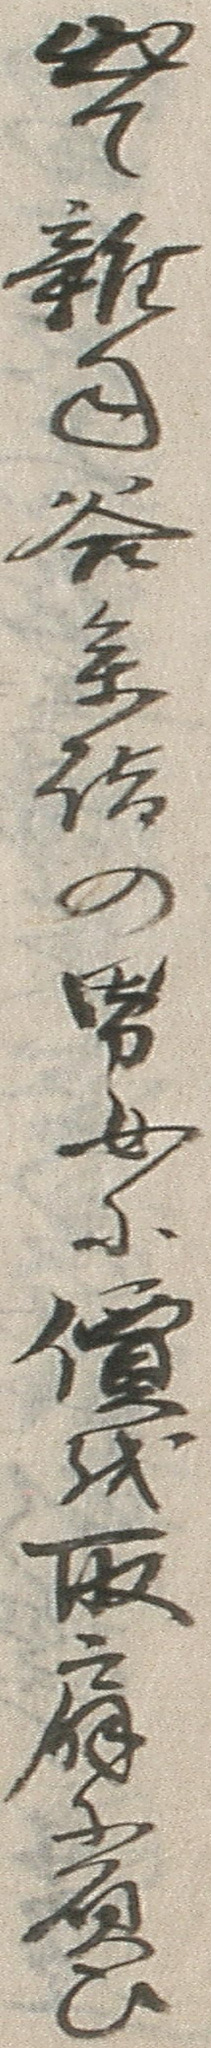出て雑司谷参詣の男女に価を取肩に負ひ
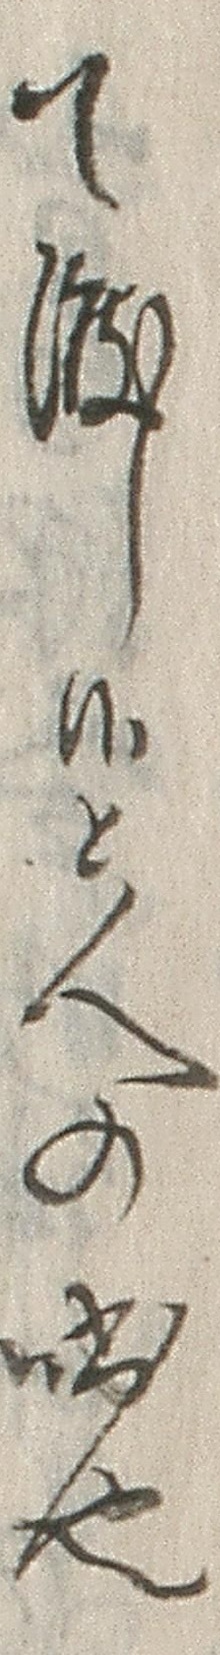て渡し候と人の咄也
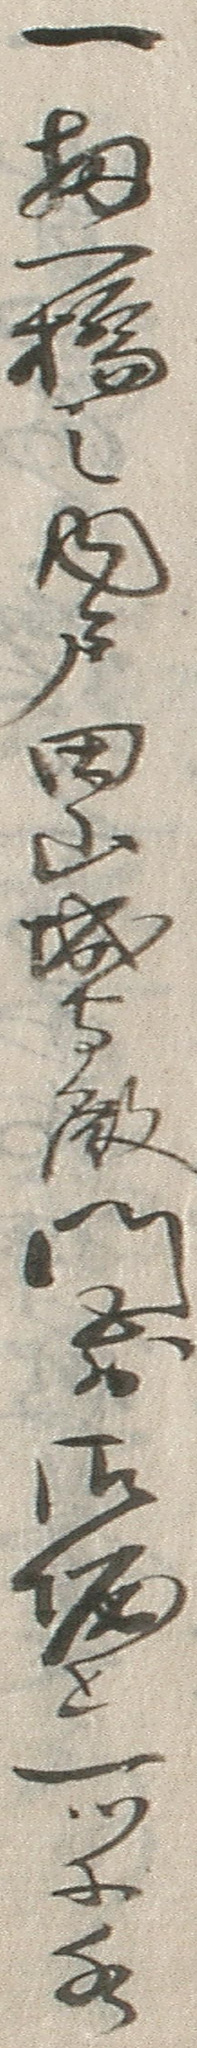一扨一橋之内戸田山城守殿門前御堀と一ツに水
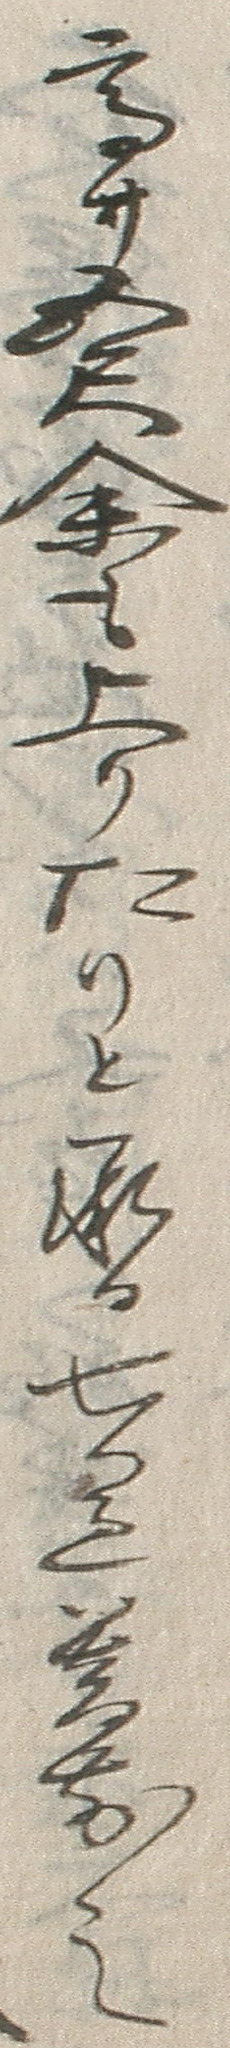高サ五尺余も上りたりと承る七つ過暮前之
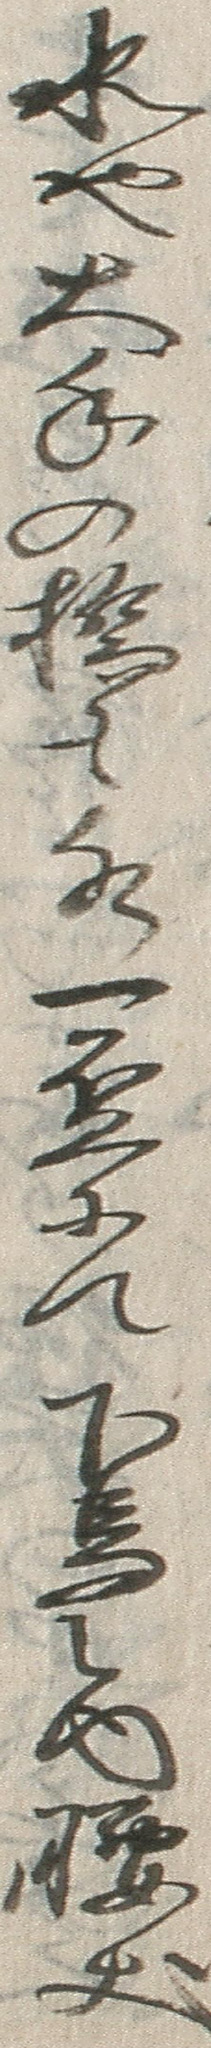水也大手の橋も水一昼にて下馬之内腰丈
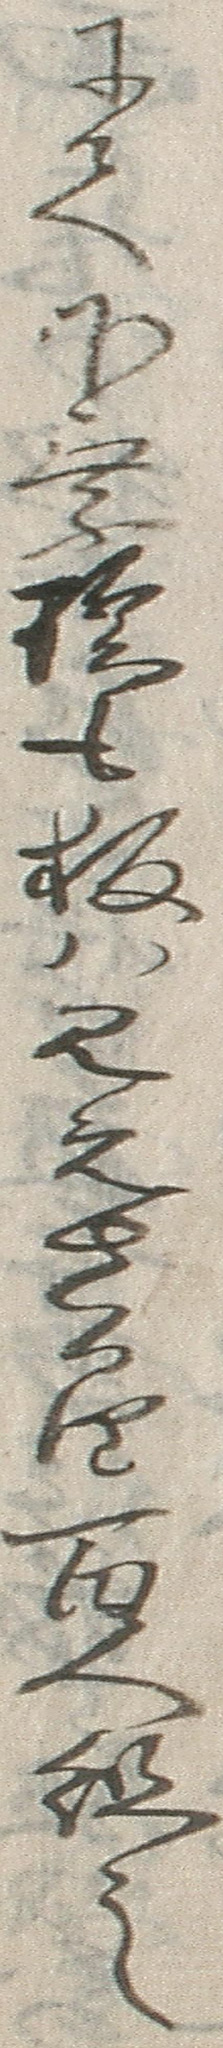にて下乗橋も板は見えさる由百人組之
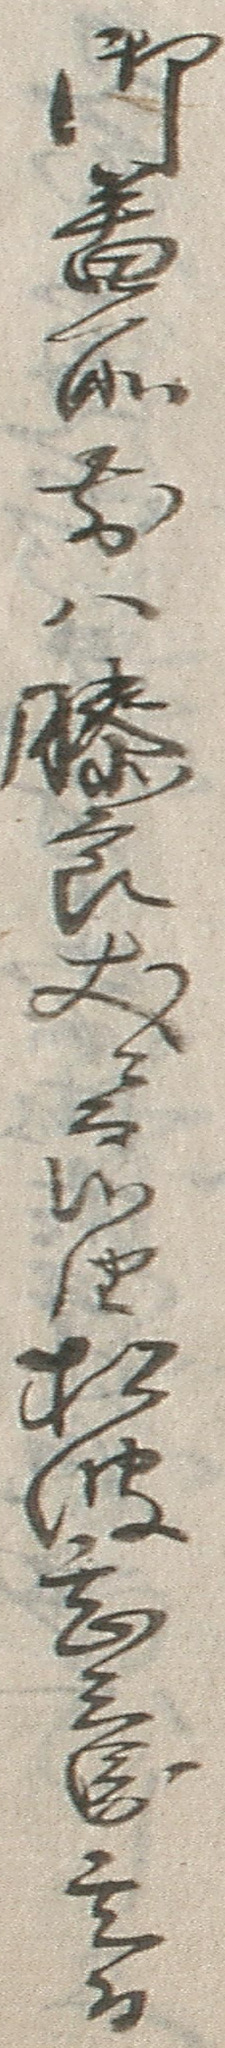御番所前は膝節丈にて候由松波甚兵衛言る

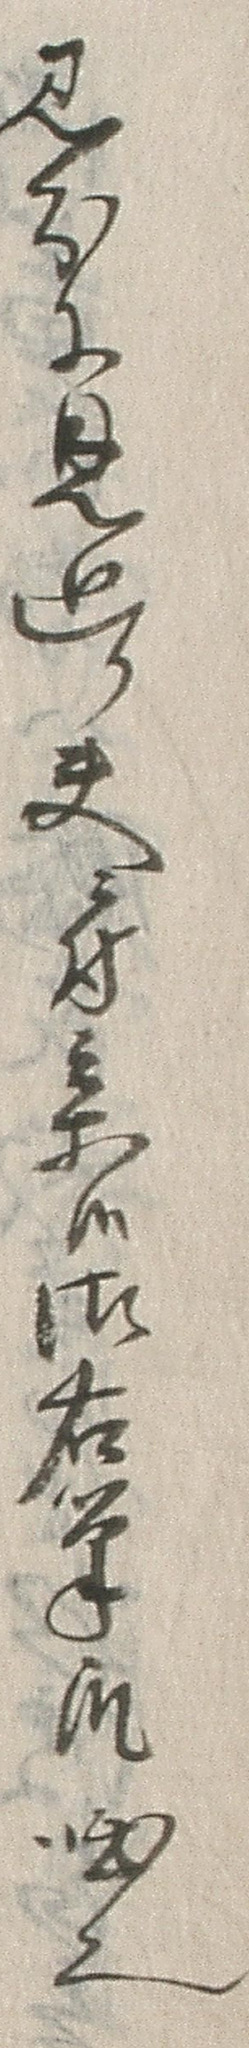見分に見廻り夫に付参候御右筆衆咄也
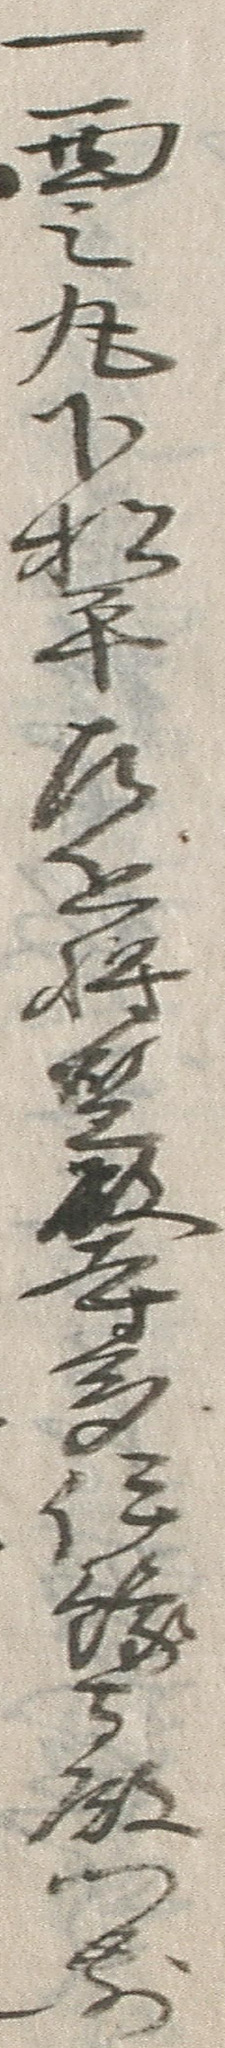一西之丸下松平左近将監殿本多伊予守殿門前
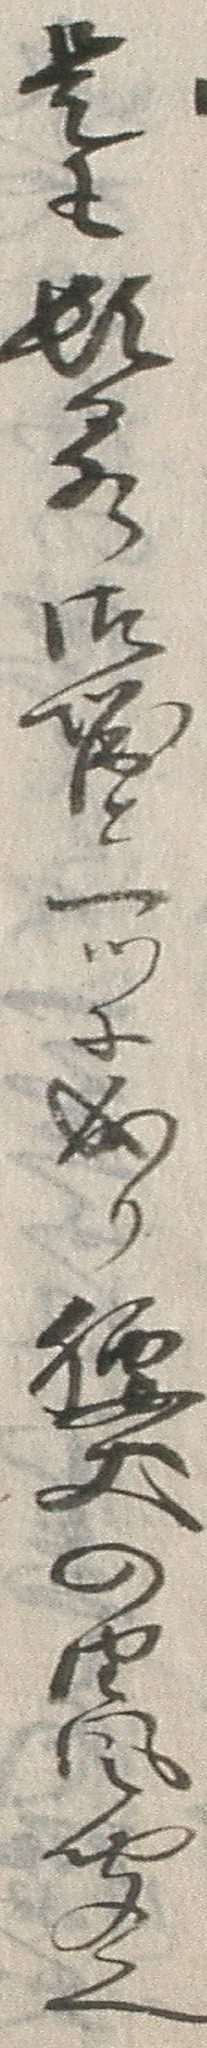是も頓て水御堀と一ツに成り腰丈の由風聞也
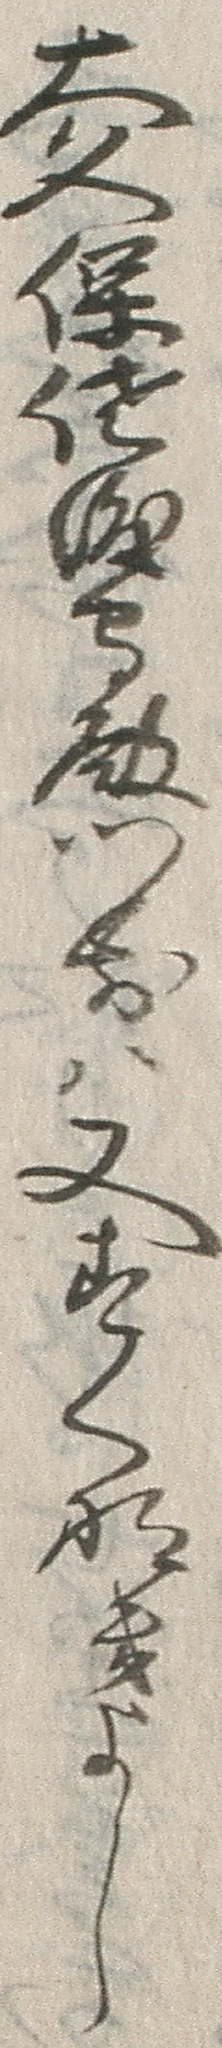大久保佐渡守殿門前は又すくなきよし
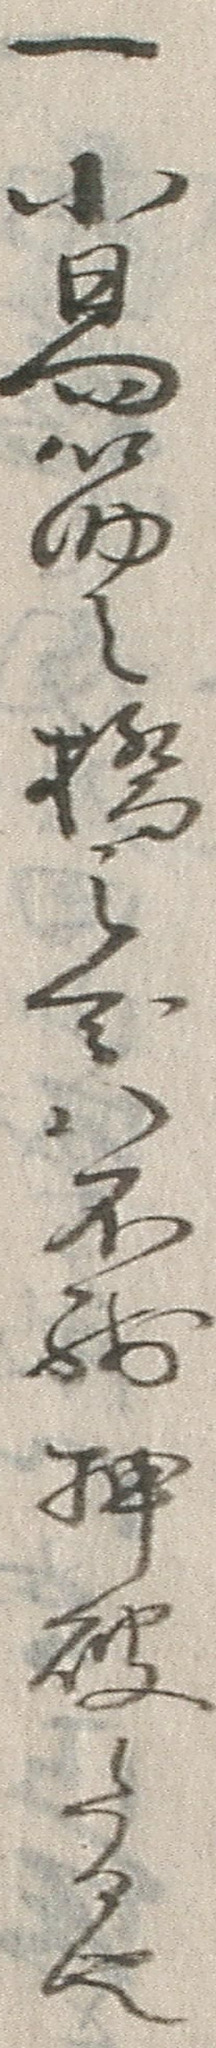一小日向筋の橋之分は不残押破たる也
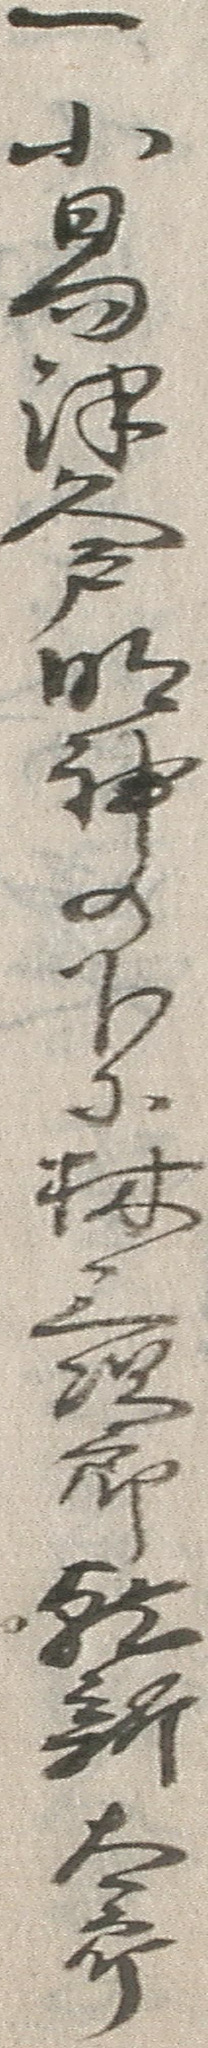一小日向津久戸明神の下小林三次郎乾新太郎
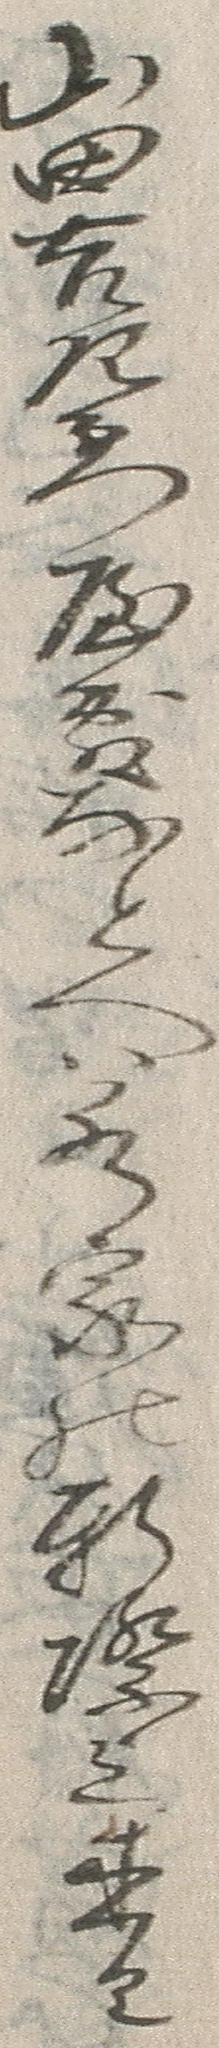山田吉左衛門屋敷なとへは水家の軒際迄来り
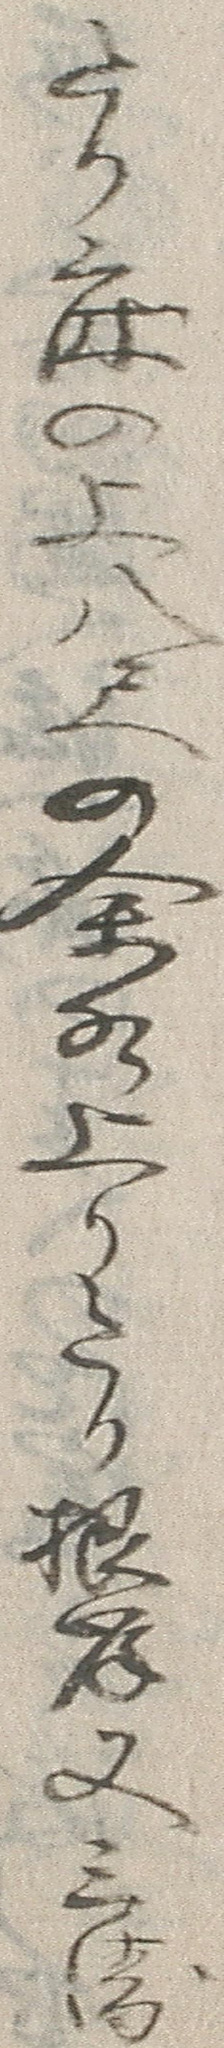たり床の上八尺の余水上りたり根岸又兵衛
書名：享保十三年江戸洪水記
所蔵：東京大学地震研究所図書室 Earthquake Research Institute Library, The University of Tokyo, JAPAN
